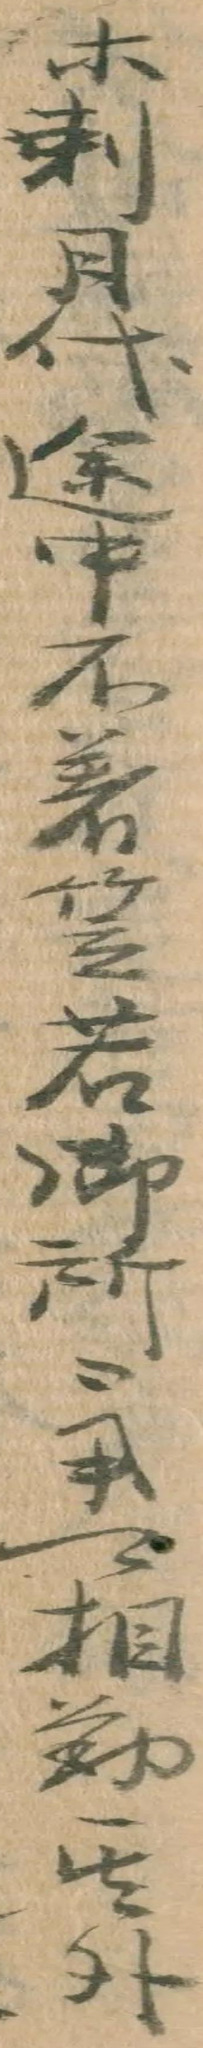等刺月代途中不着笠、若御所御用可相勤、其外
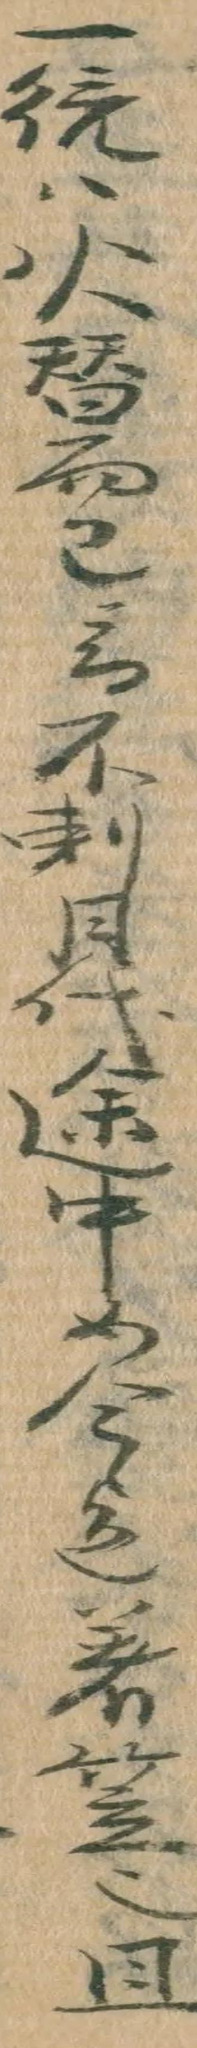一統ハ火替而已ニ而不刺月代途中如、今迄着笠也、且
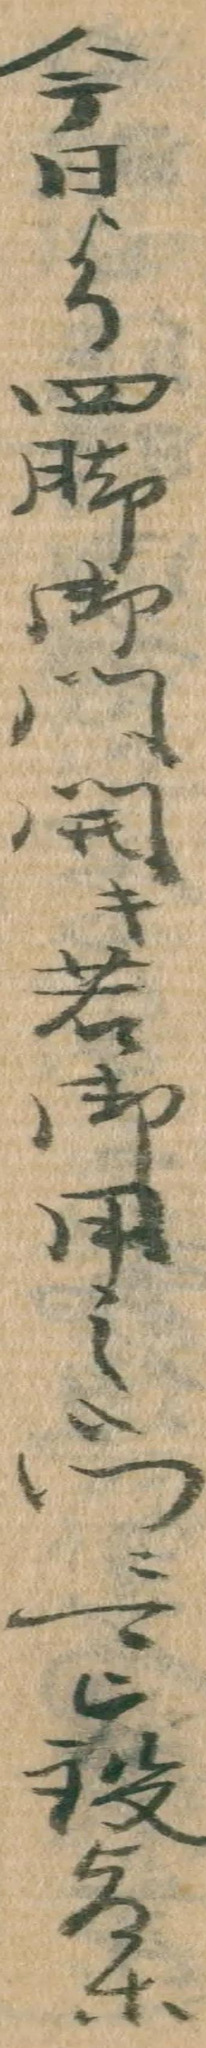今日より四脚御門開キ、若御用之御門ニ可被致旨等
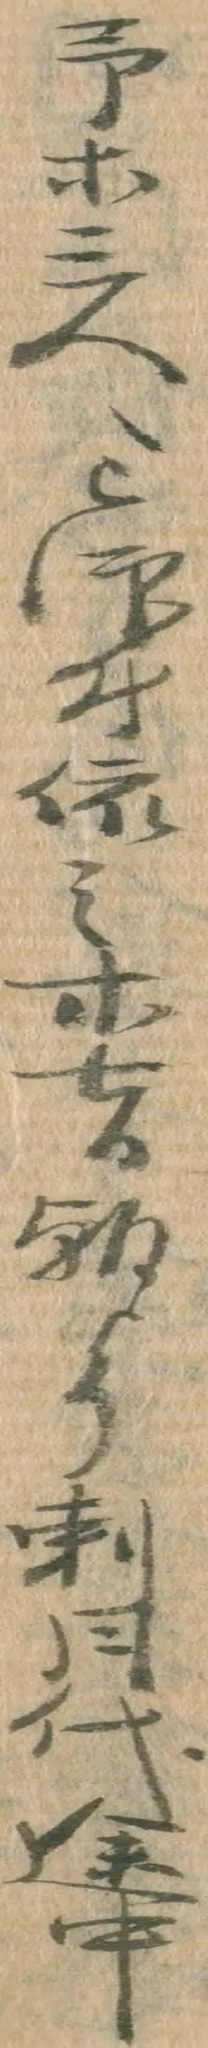予等三人へ被仰付、依之廿七日朝より刺月代途中
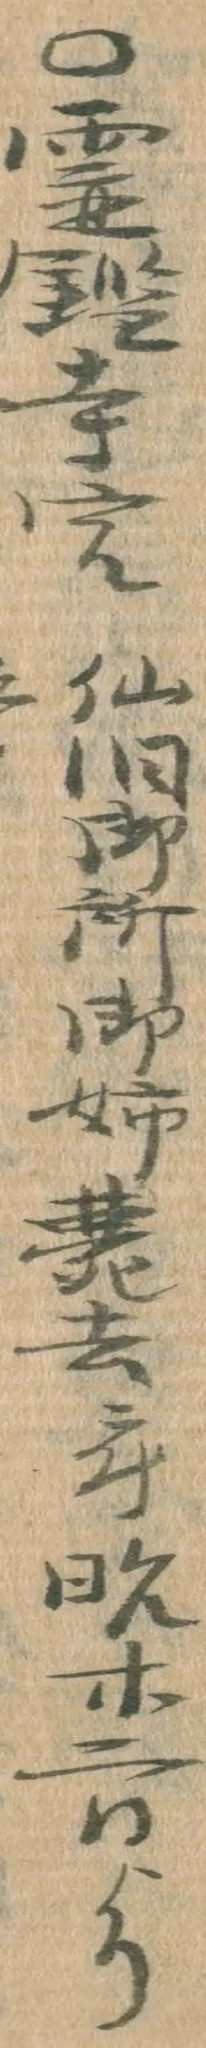○霊鑑寺宮仙洞御所御姉薨去ニ付、晩廿二日より
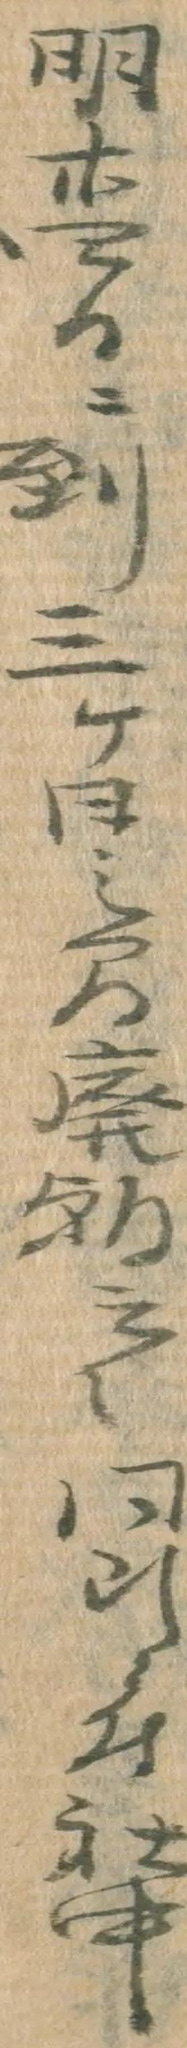明廿四日ニ到三ヶ日之間廃朝云〻、同断ニ付、社中
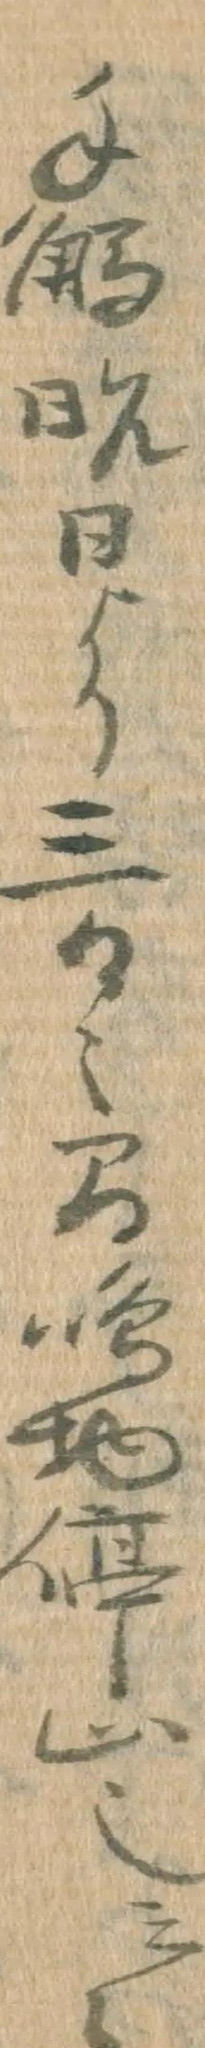手触、昨日より三日之間鳴物停止也云〻、
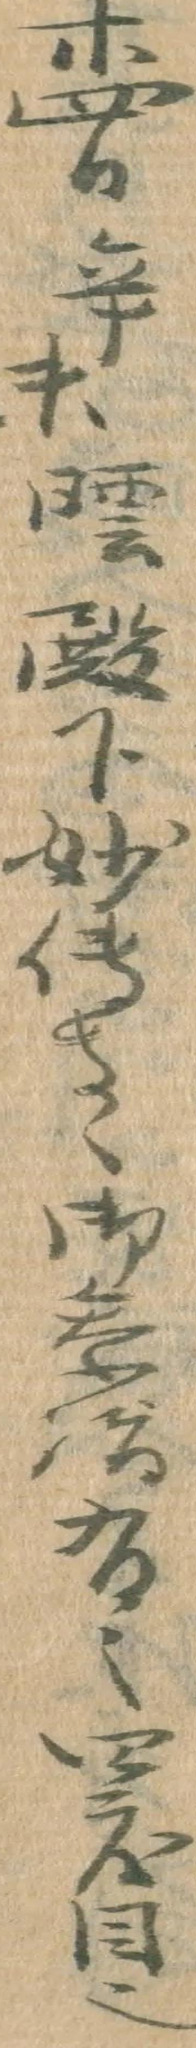廿四日辛未曇、殿下妙傳寺へ御参詣有之、四度目也、
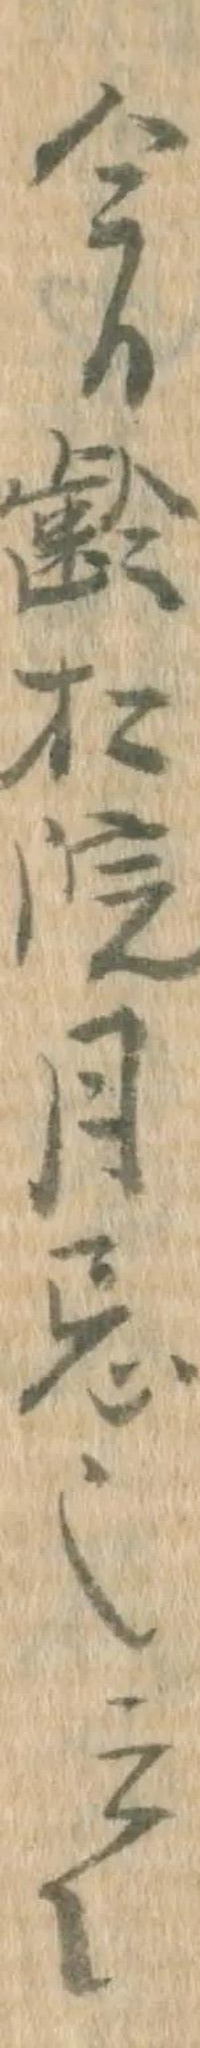今日齢松院月忌也云〻、
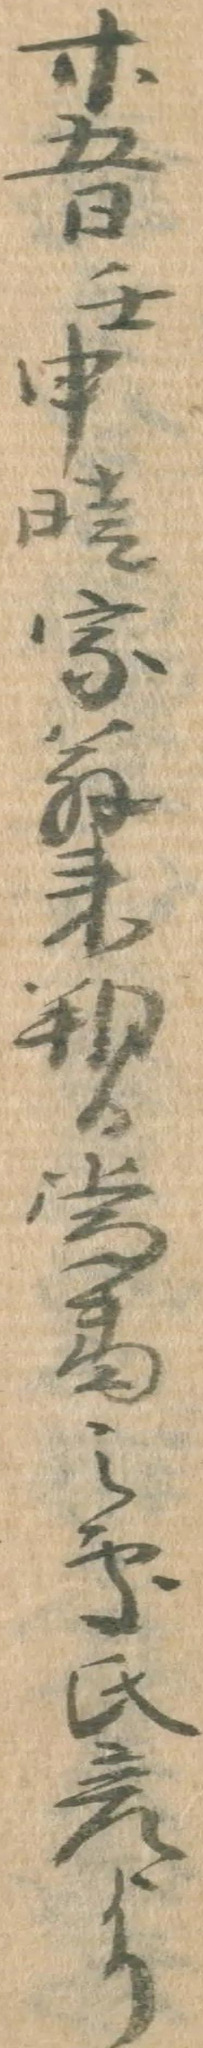廿五日壬申晴、家翁来朔日當番之處、氏彦より

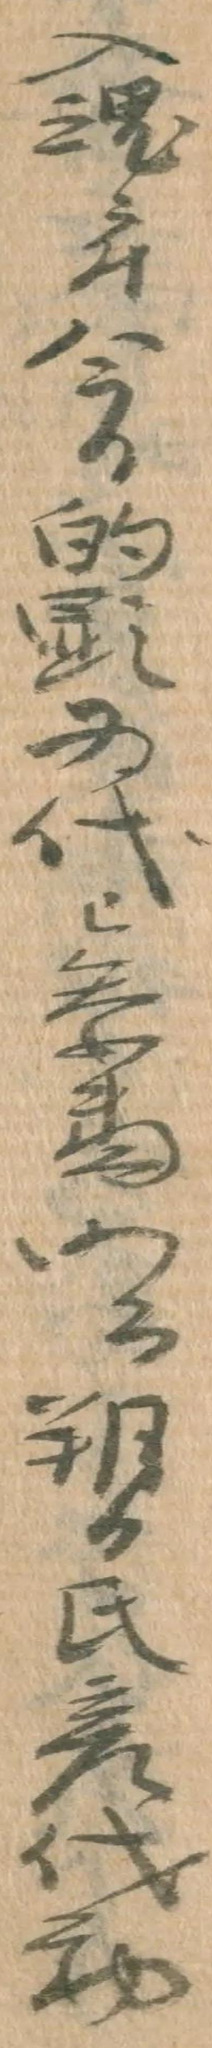入魂ニ付、今日的顕為代被参番、仍而朔日氏彦代勘
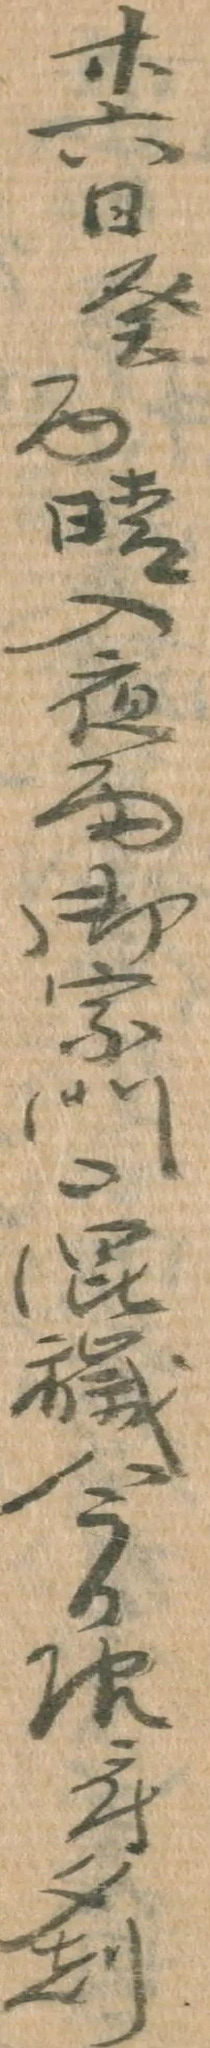廿六日癸酉晴、入夜雨、御家門御混穢今日限ニ付、夕刻
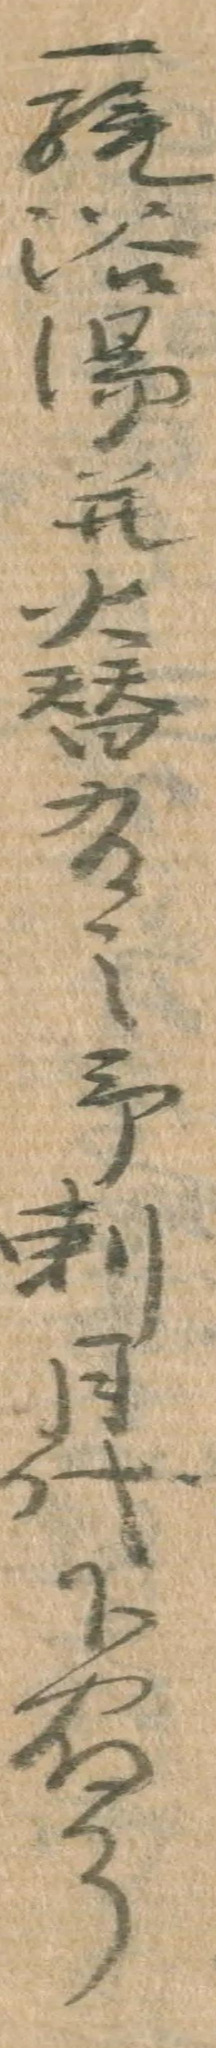一統浴湯并火替有之、予刺月代下宿了、
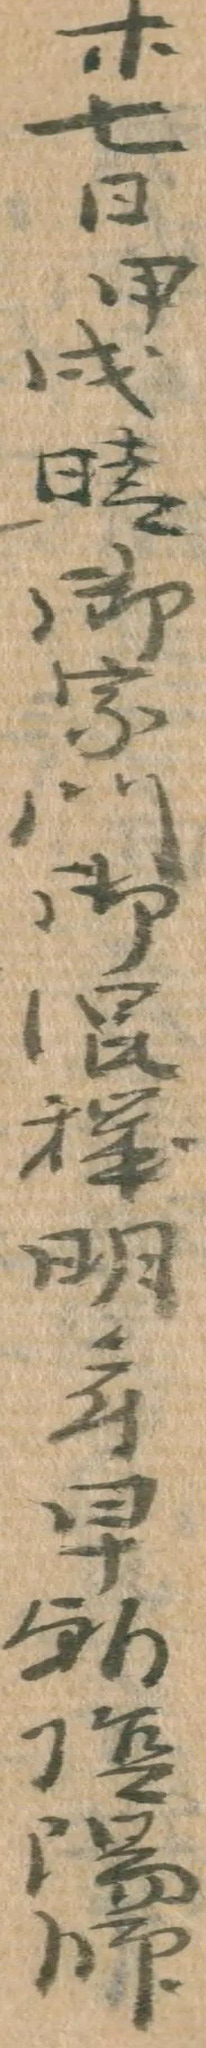廿七日甲戌晴、御家門御混穢明ニ付、早朝陰陽師
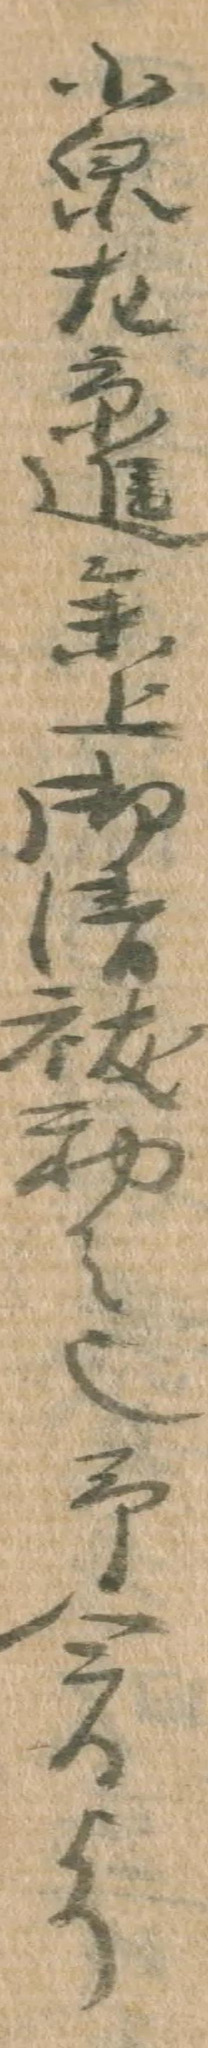小泉左京進参上、御清祓勤之也、予今日より
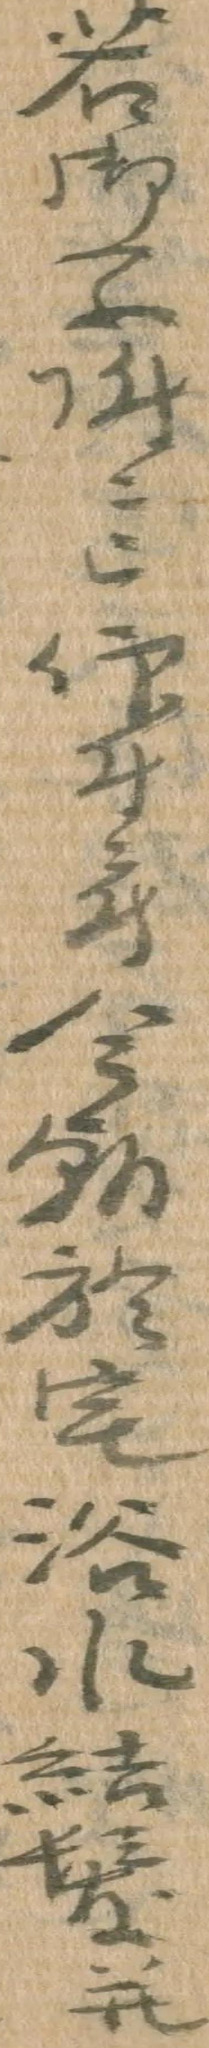若御子附に被仰付ニ付、今朝於宅浴水結髪并
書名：賀茂社記録. 第63冊
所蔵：国立国会図書館 National Diet Library, JAPAN
